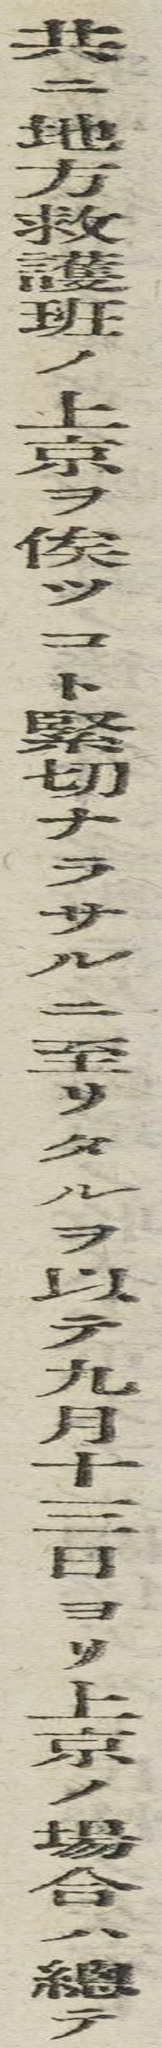共ニ地方救護班ノ上京ヲ待ツコト緊切ナラサルニ至リタルヲ以テ九月十三日ヨリ上京ノ場合ハ総テ
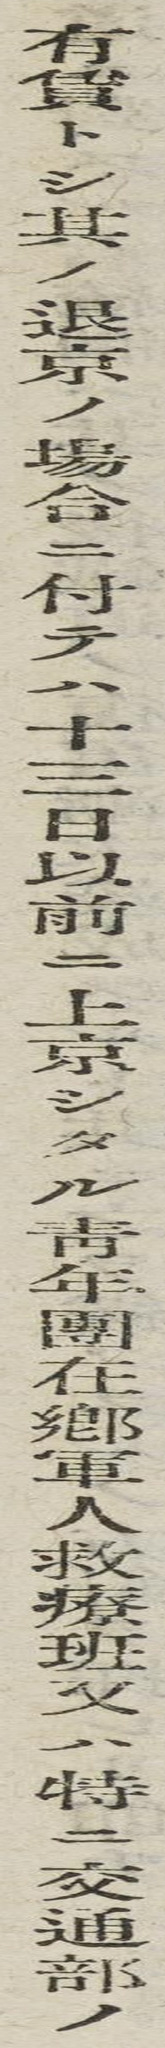有賃トシ其ノ退京ノ場合ニ付テハ十三日以前ニ上京シタル青年団在郷軍人救療班又ハ特ニ交通部ノ
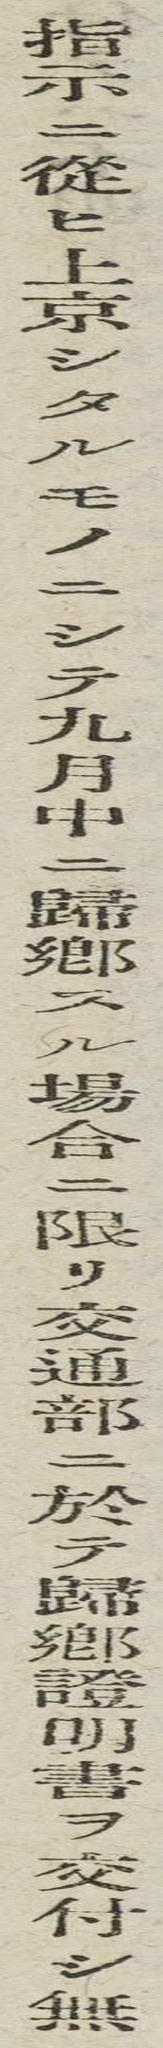指示ニ従ヒ状況シタルモノニシテ九月中ニ帰郷スル場合ニ限リ交通部ニ於テ帰郷証明書ヲ交付シ無
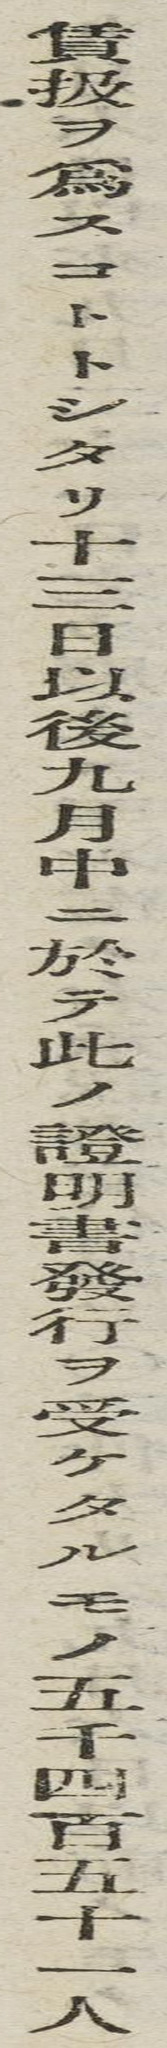賃扱ヲ為スコトトシタリ十三日以後九月中ニ於テ此ノ證明書発行ヲ受ケタルモノ五千四百五十一人
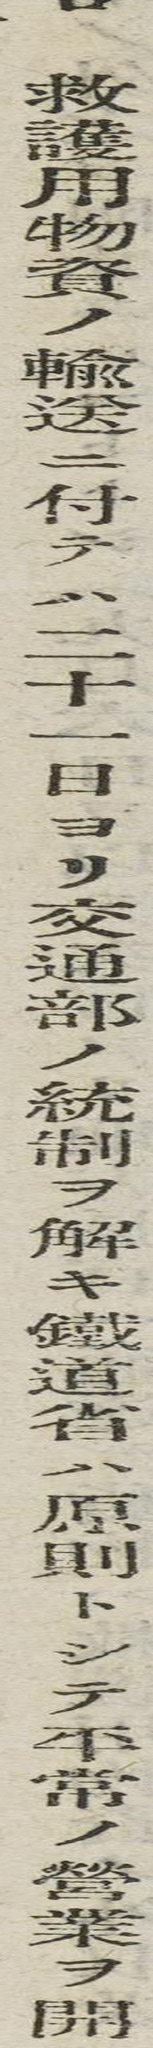救護用物資ノ輸送ニ付テハ二十一日ヨリ交通部ノ統制ヲ解キ鉄道省ハ原則トシテ平常ノ営業ヲ開
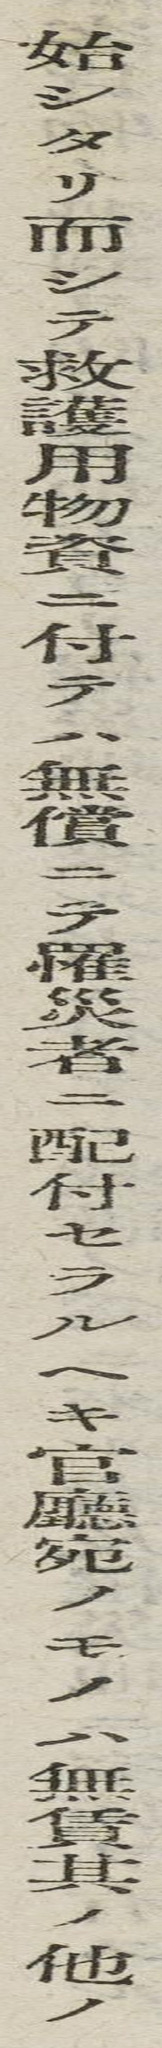始シタリ而シテ救護用物資ニ付テハ無償ニテ罹災者ニ配布セラルヘキ官庁宛ノモノハ無賃其ノ他ノ
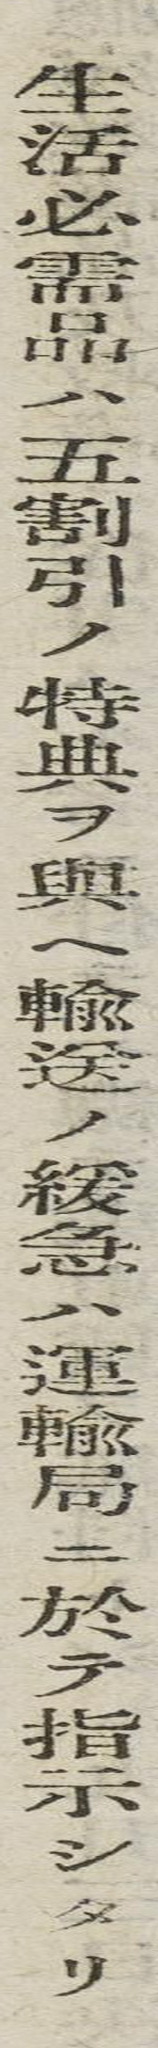生活必需品ハ五割引ノ特典ヲ与ヘ輸送ノ緩急ハ運輸局ニ於テ指示シタリ
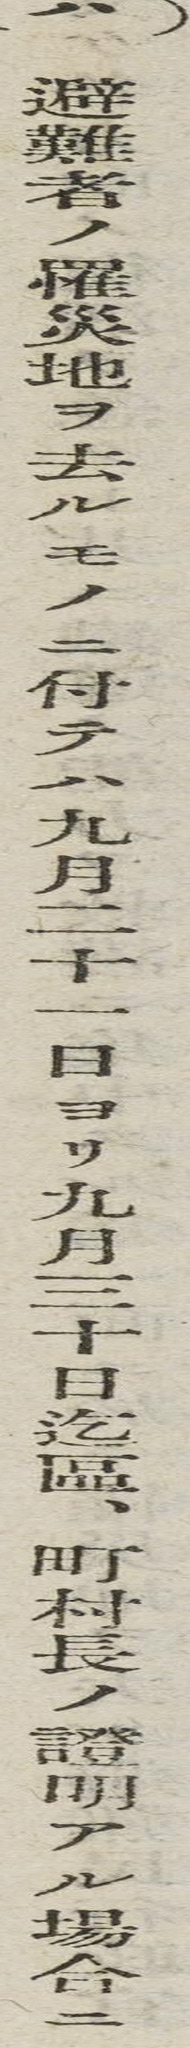避難者ノ罹災地ヲ去ルモノニ付テハ九月二十一日ヨリ九月三十日迄区、町村長ノ證明アル場合ニ
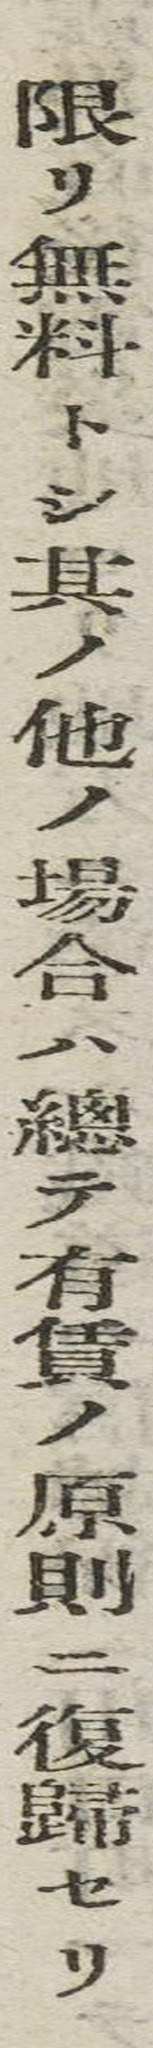限リ無料トシ其ノ他ノ場合ハ総テ有賃ノ原則ニ復帰セリ
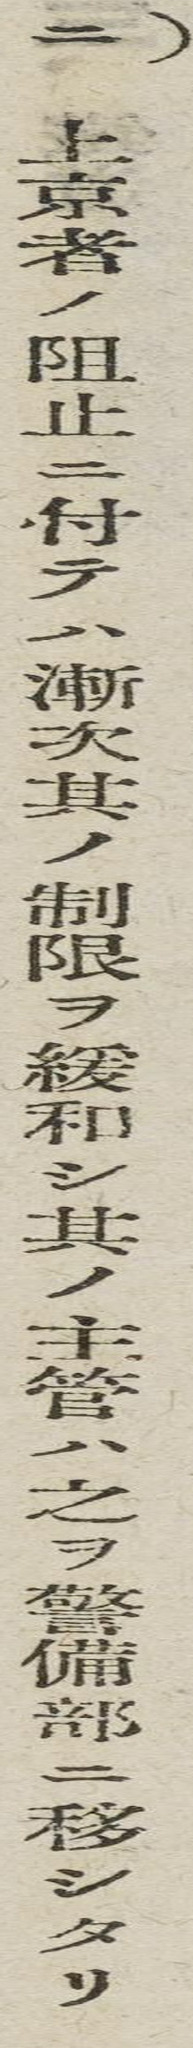上京者ノ阻止ニ付テハ漸次其ノ制限ヲ緩和シ其ノ主管ハ之ヲ警備部ニ移シタリ
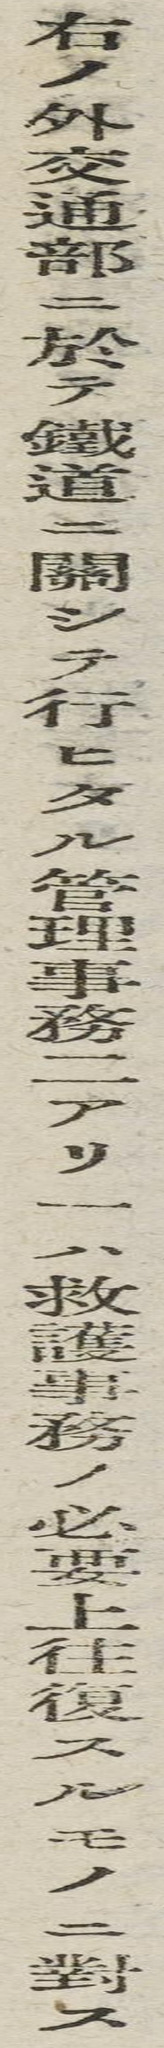右ノ外交通部ニ於テ鉄道ニ関シテ行ヒタル管理事務ニアリ一ハ救護事務ノ必要上往復スルモノニ対ス
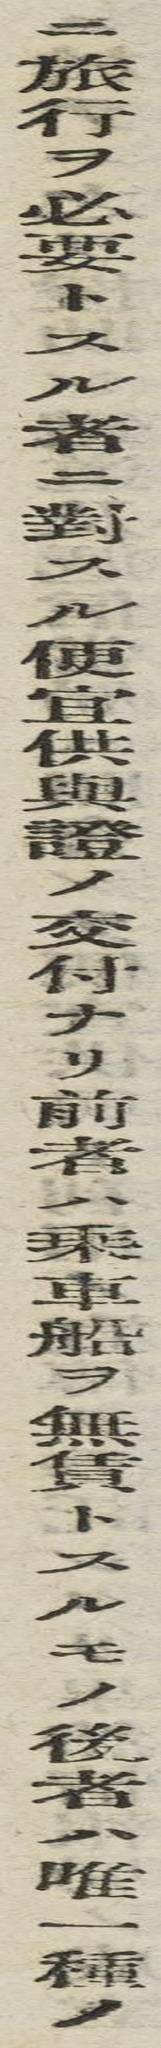ニ旅行ヲ必要トスル者ニ対スル便宜供与証ノ交付ナリ前者ハ乗車船ヲ無賃トスルモノ後者ハ唯一種ノ
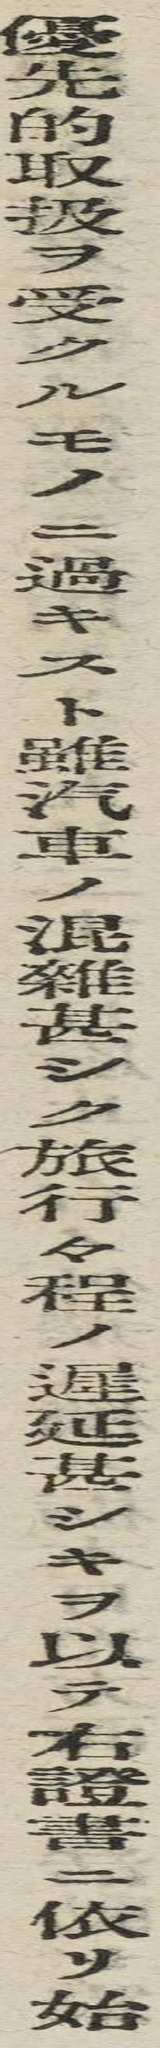優先的取扱ヲ受クルモノニ過キスト雖汽車ノ混雑甚シク旅行々程ノ遅延甚シキヲ以テ右証書ニ依リ始
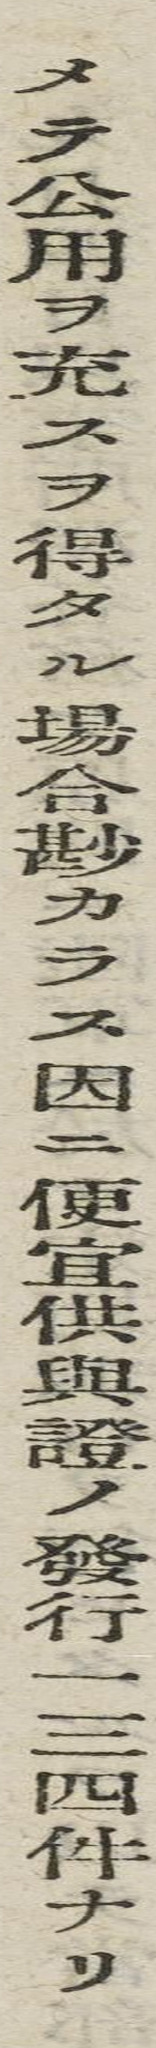メテ公用ヲ充スヲ得タル場合少カラス因ニ便宜供与証ノ発行一三四件ナリ
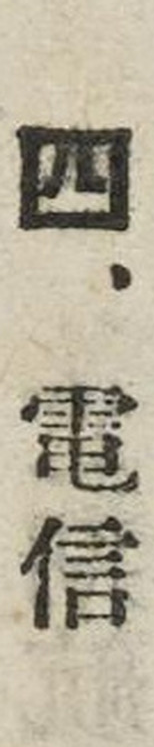四、電信
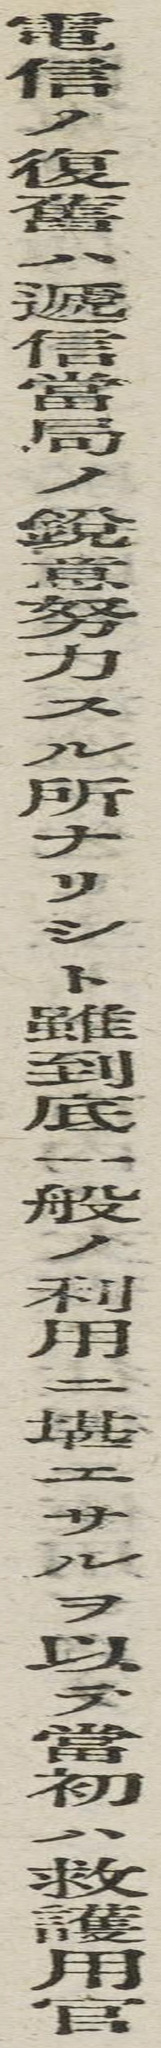電信ノ復旧ハ逓信当局ノ鋭意努力スル所ナリシト雖到底一般ノ利用ニ堪エサルヲ以テ当初ハ救護用官
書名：震災被害状況並救護施設概要
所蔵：東京大学地震研究所図書室 Earthquake Research Institute Library, The University of Tokyo, JAPAN
